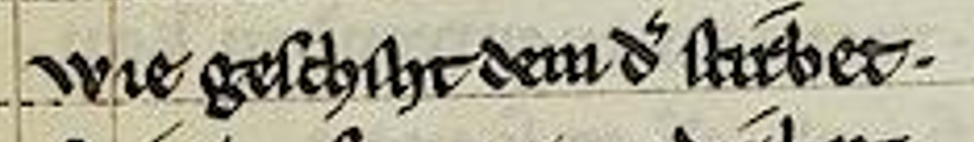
Wie geſchiht dem d(er) ſtirbet.
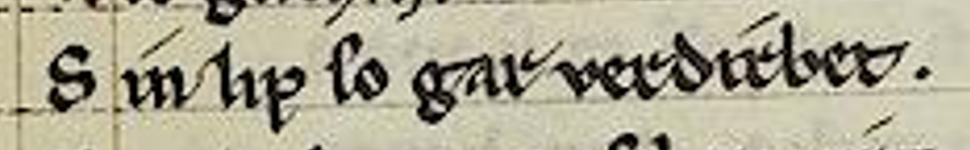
Sin lip ſo gar verdirbet.
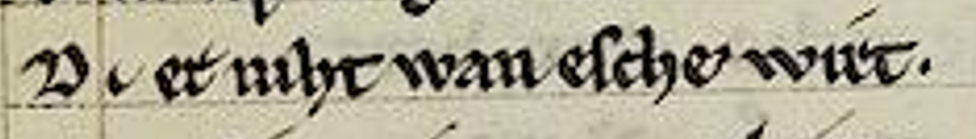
D(az) er niht wan eſche wirt.
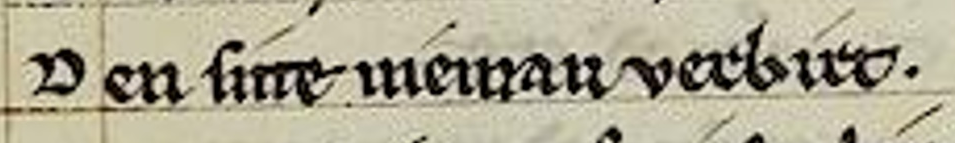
Den ſitte nieman verbirt.
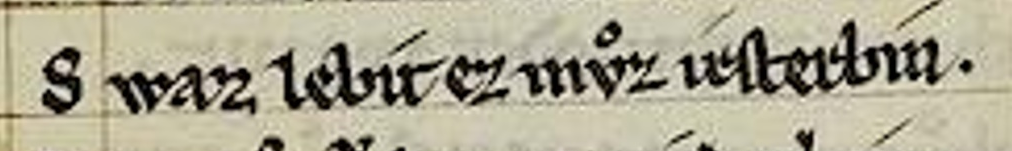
Swaz lebit ez mv°oz irſterbin.
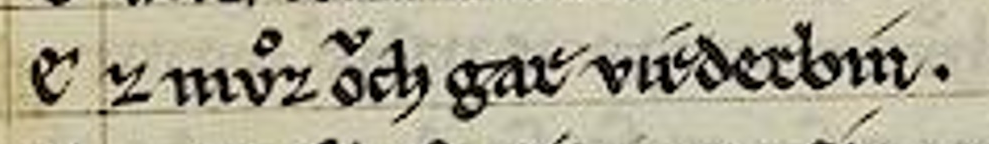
Ez mv°oz o°vch gar virderbin.
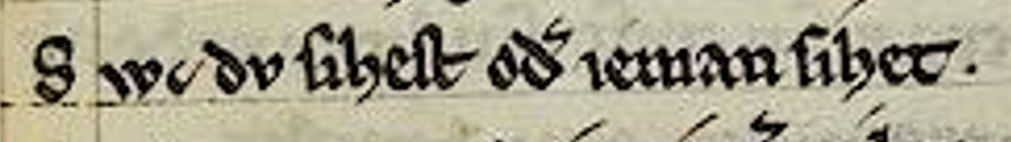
Sw(az) dv ſiheſt od(er) ieman ſihet.
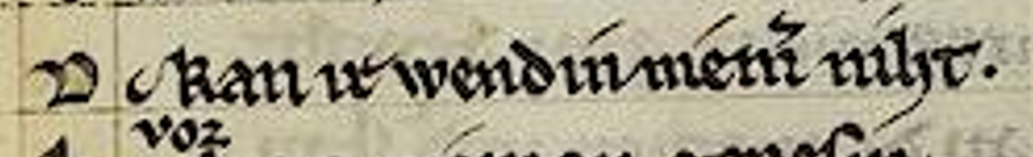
D(az) kan ir wendin niem(er) niht.
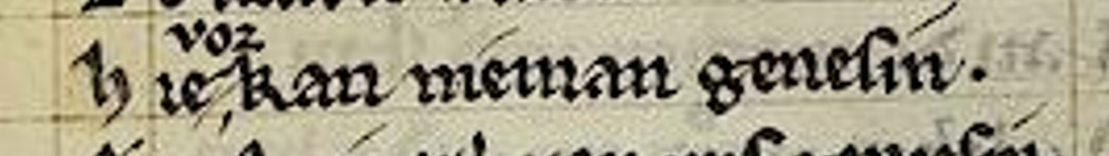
Hie °(vor) kan nieman geneſin.
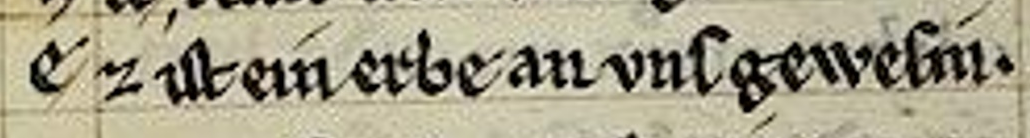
Ez iſt ein erbe an vnſ geweſin.
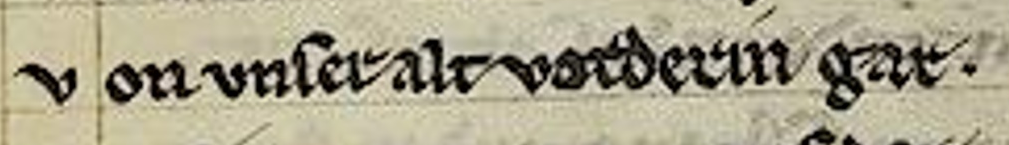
Von vnſer alt vorderin gar.
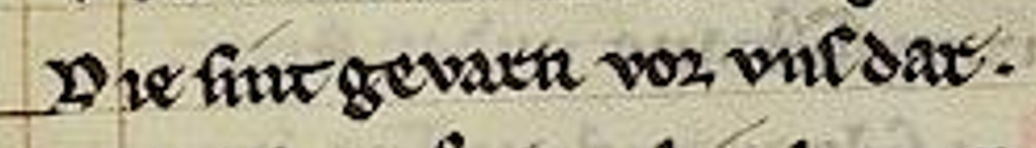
Die ſint gevarn vor vnſ dar.
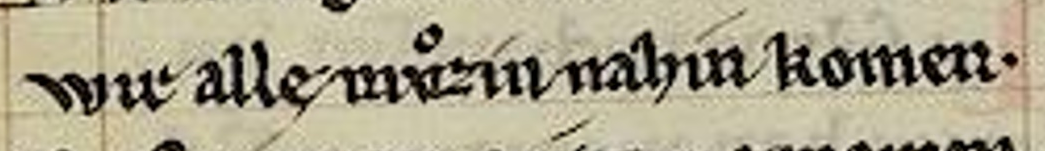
Wir alle mv°ozin nahin komen.
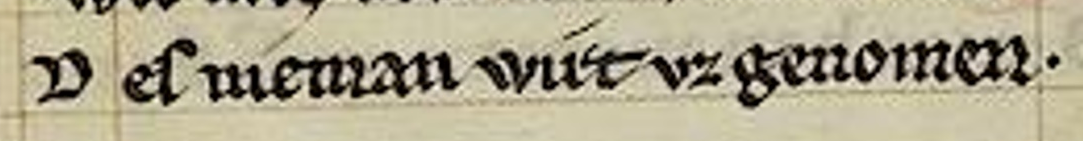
Deſ nieman wirt vz genomen.
